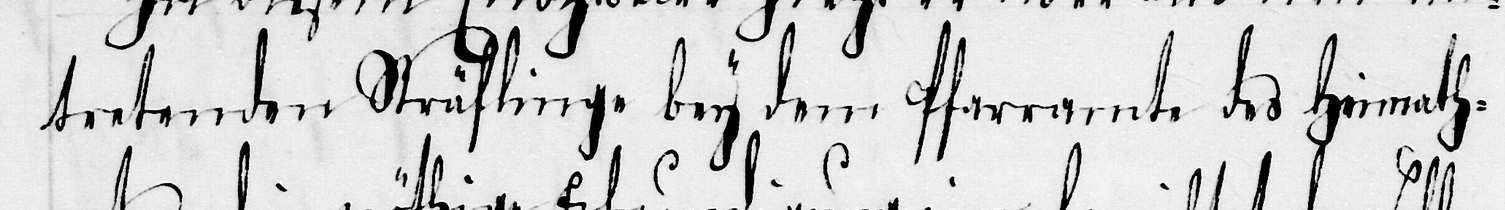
tretenden Sträflinge bey dem Pfarramte des Heimath¬
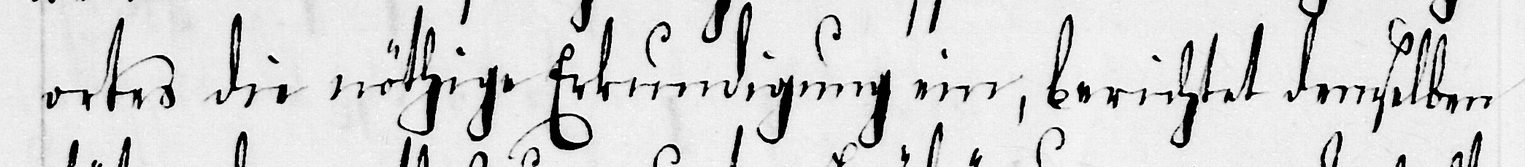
ortes die nöthige Erkundigung ein, berichtet demselben
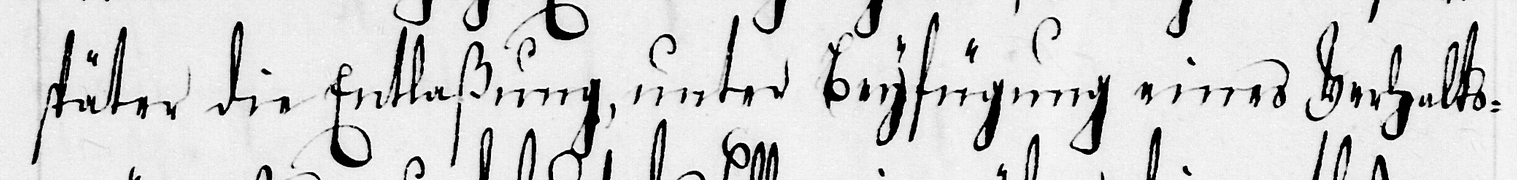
später die Entlaßung, unter Beyfügung eines Verhalts¬
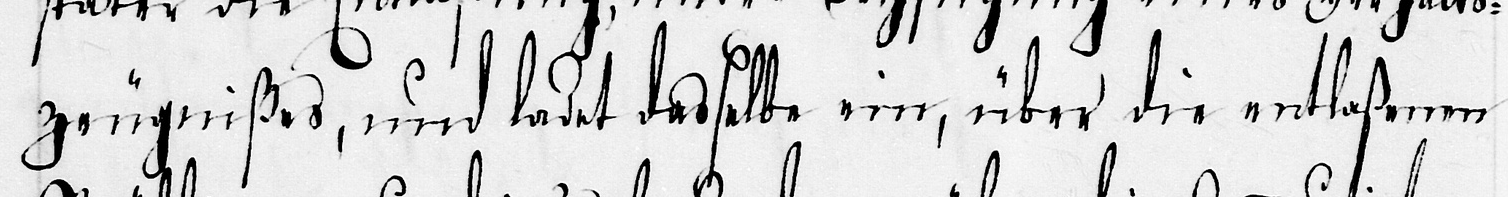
zeugnißes, und ladet dasselbe ein, über die entlaßenen
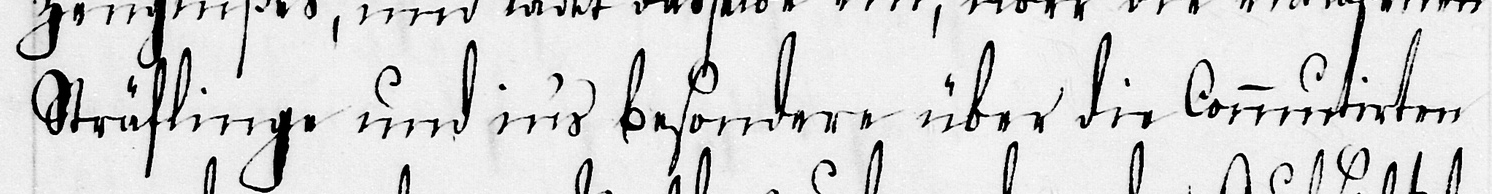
Sträflinge und in’s besondere über die Commutirten
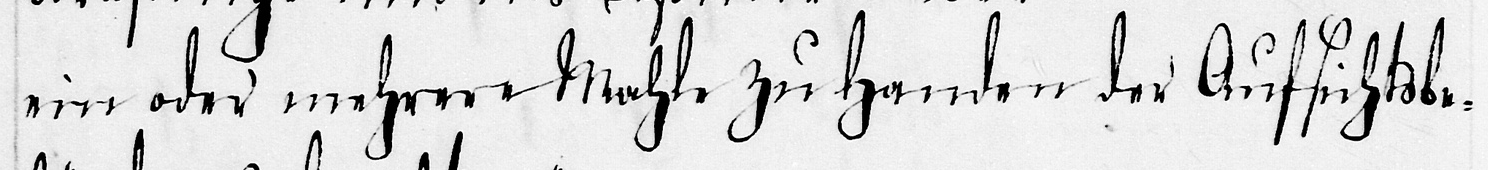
ein oder mehrere Mahle zu Handen der Aufsichtsbe¬
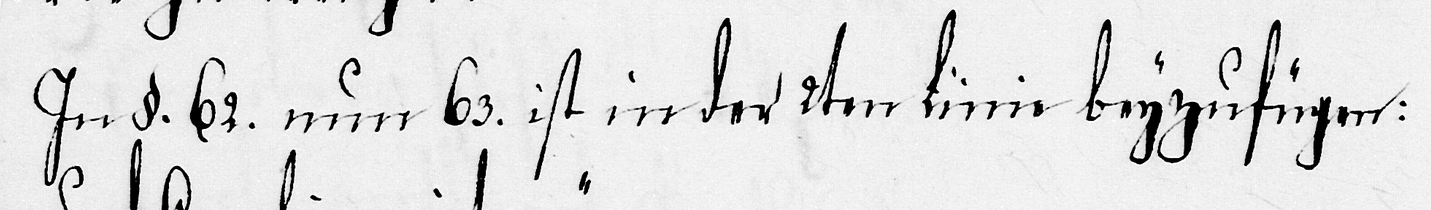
In §. 62. nun 63. ist in der 2ten Linie beyzufügen:
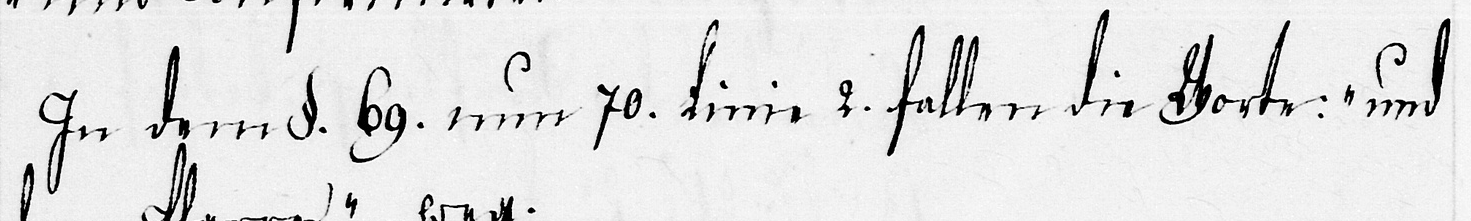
In dem §. 69. nun 70. Linie 2. fallen die Worte: „und
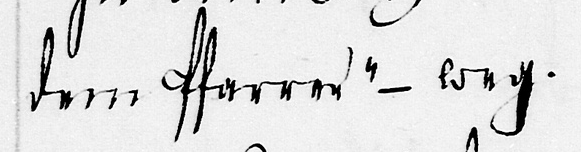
dem Pfarrer“ – weg.
